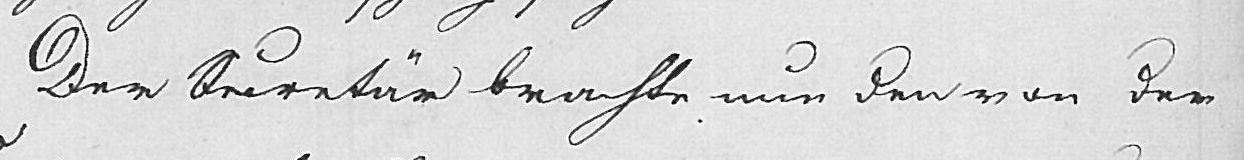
Der Secretär brachte nun den von der
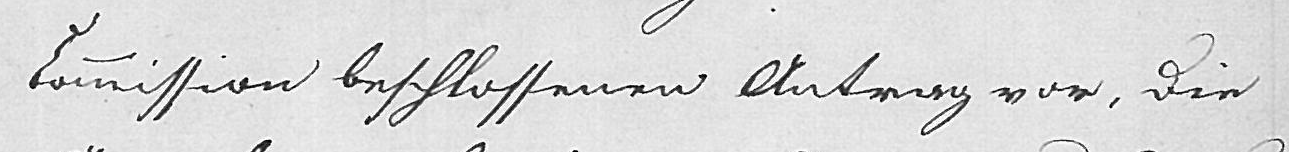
Commission beschlossenen Antrag vor, die
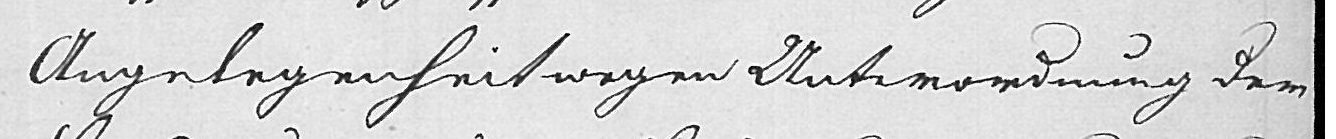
Angelegenheit wegen Unterordung der
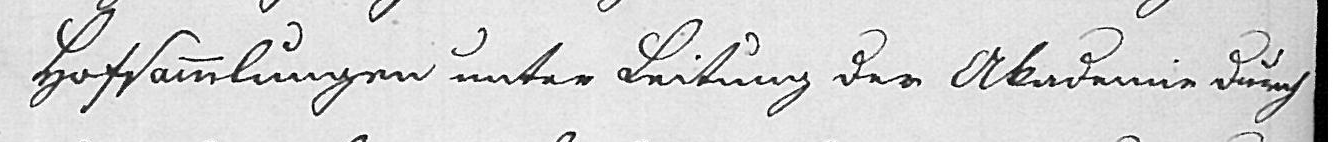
Hofsammlungen unter Leitung der Akademie durch
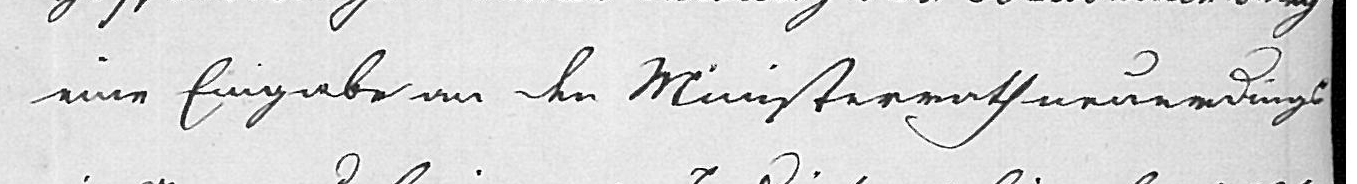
eine Eingabe an der Ministerrath neuerdings
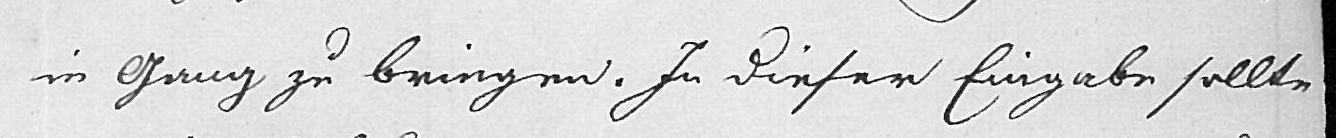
in Gang zu bringen. In dieser Eingabe sollte
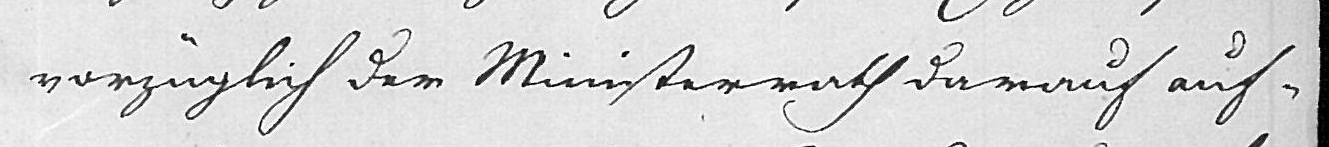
vorzüglich der Ministerrath darauf auf-
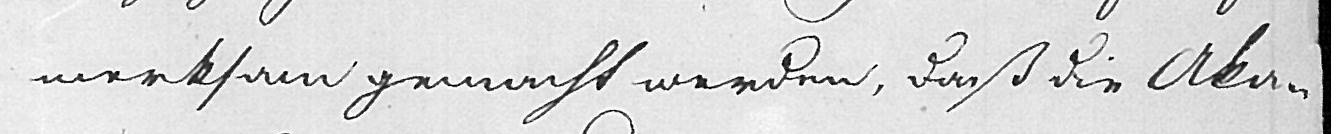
merksam gemacht werden, daß die Aka-
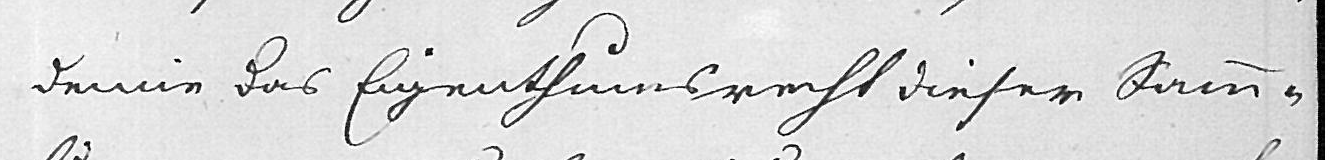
demie das Eigenthumsrecht dieser Samm-
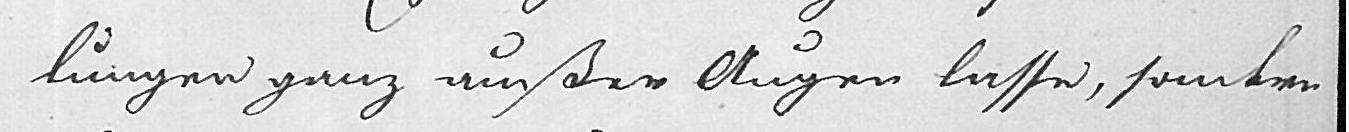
lungen ganz außer Augen lassen, sondern
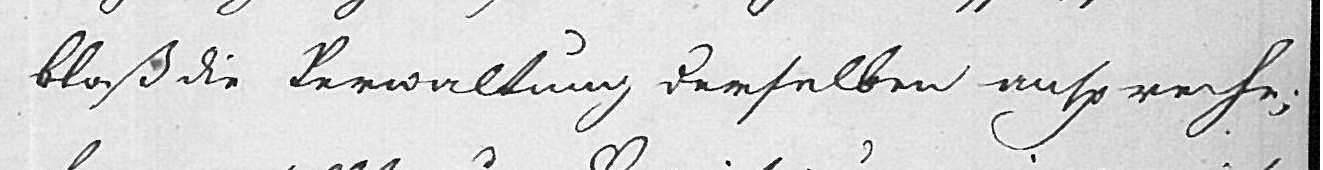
bloß die Verwaltung derselben entspreche,
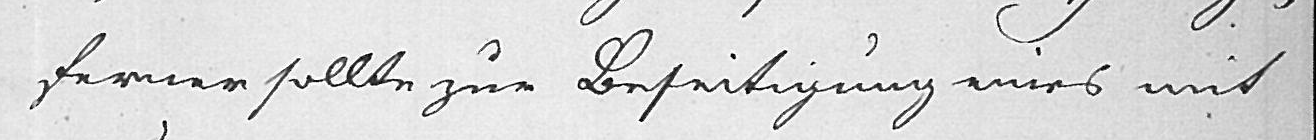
ferner sollte zur Beseitigung eines mit
